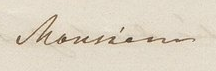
Monsieur
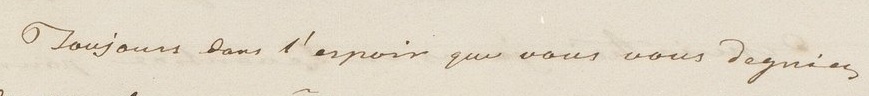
Toujours dans l'espoir que vous vous degniez
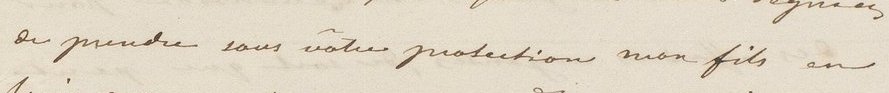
de prendre sous vôtre protection mon fils en
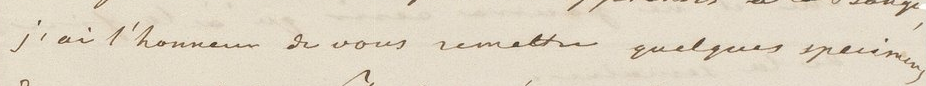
j'ai l'honneur de vous remettre quelques specimens
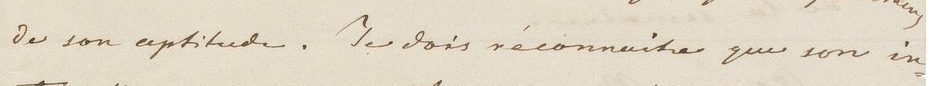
de son aptitude. Je dois réconnaitre que son in-
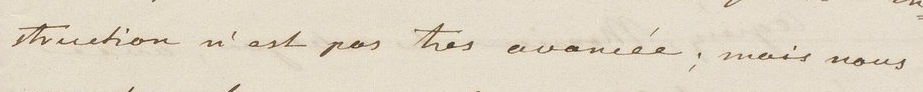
struction n'est par tres avancée; mais nous
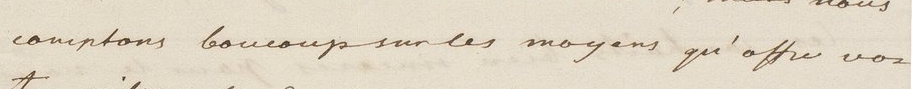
comptons baucoup sur les moyens qu'offre vo-
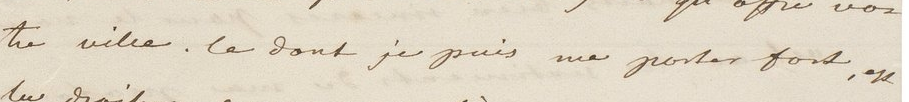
tre ville. La dont je puis me porter fort, est
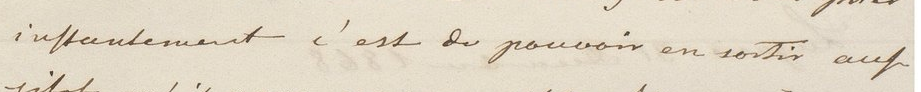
instantement c'est de pouvoir en sortir aus-
